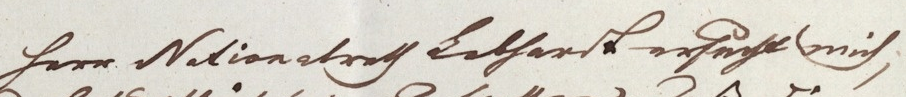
Herr Nationalrath Labhardt ersucht mich,
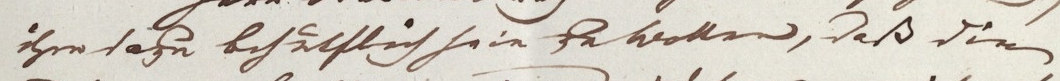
ihm dazu behülflich sein zu wollen, daß die
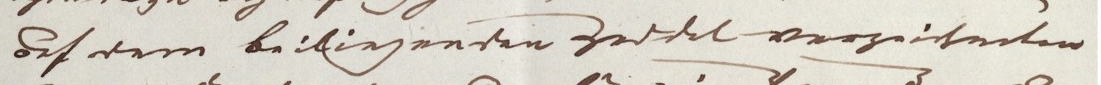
auf dem beiliegenden Zeddel verzeichneten
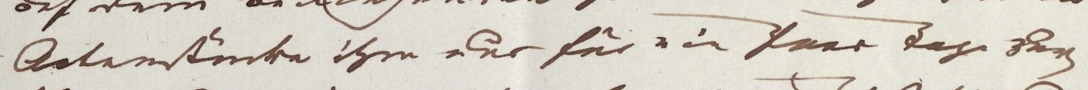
Actenstücke ihm nur für ein Paar Tage zur
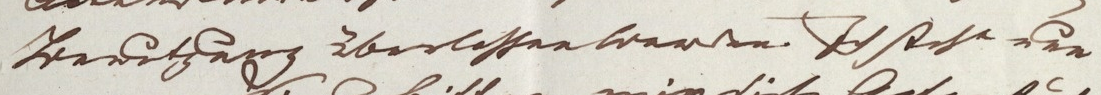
Benutzung überlassen werden. Ich stehe nun
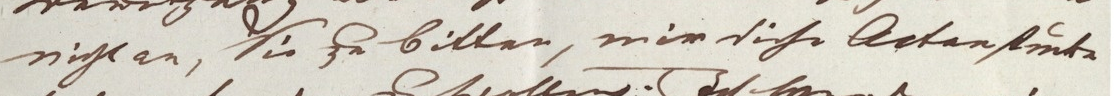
nicht an, Sie zu bitten, mir diese Actenstücke
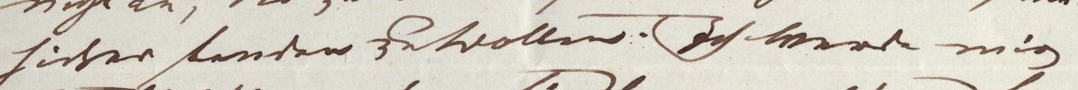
hierher senden zu wollen. Ich werde mir
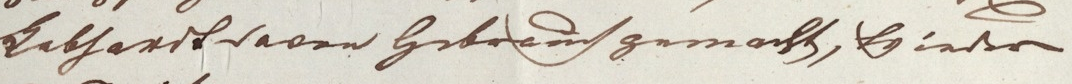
Labhardt davon Gebrauch gemacht, wieder
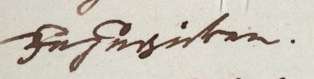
zuzuschicken.
